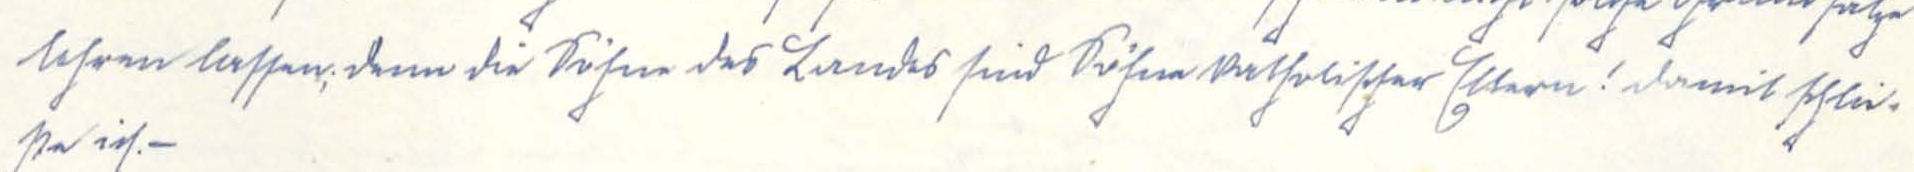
lehren lassen, denn die Söhne des Landes sind Söhne katholischer Eltern! Damit schli-
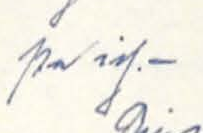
ße ich-
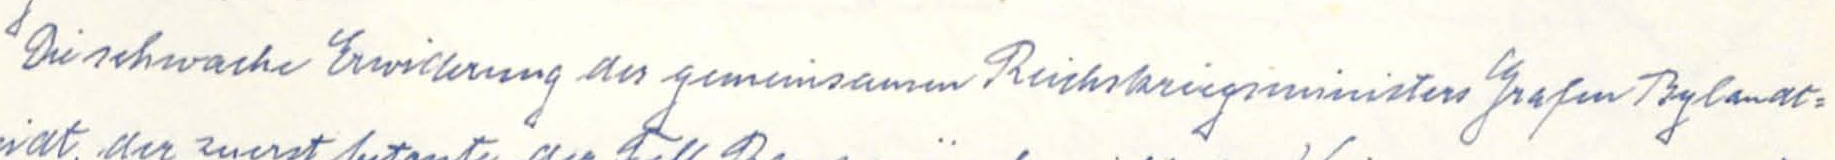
Die schwache Erwiderung des gemeinsamem Reichskriegsministers Grafen Bylandt-
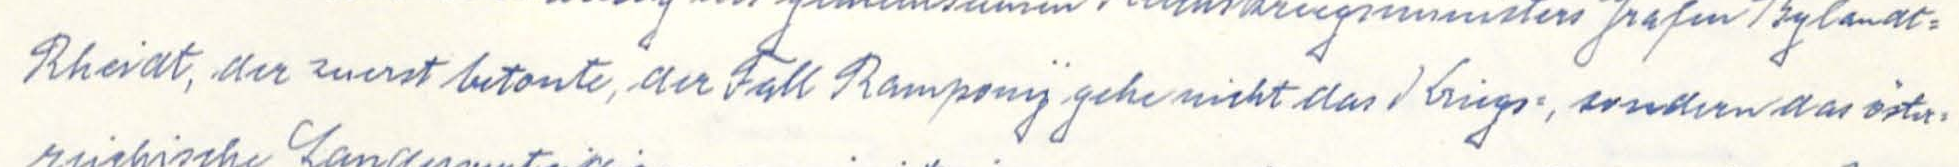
Rheidt, der zuerst betonte, der Fall Ramponij gehe nicht das Kriegs-, sondern das öster-
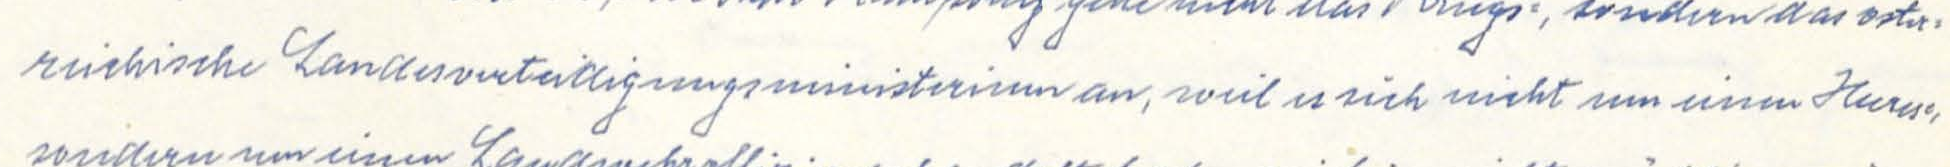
reichische Landesverteidigungsministerium an, weil es sich nicht um einen Heeres-,
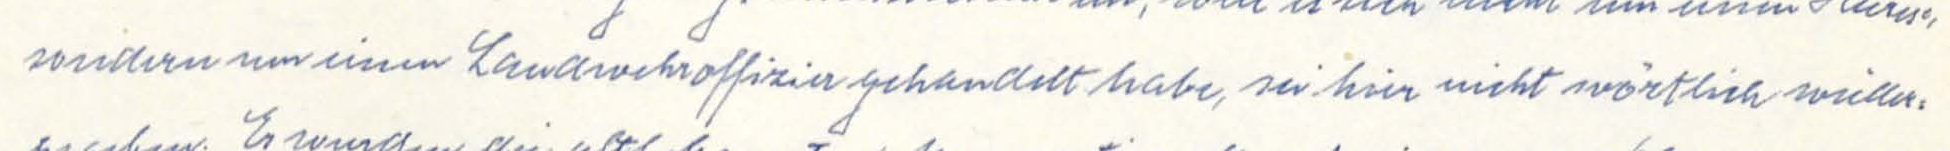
sondern um einen Landwehroffizier gehandelt habe, sei hier nicht wörtlich wieder-
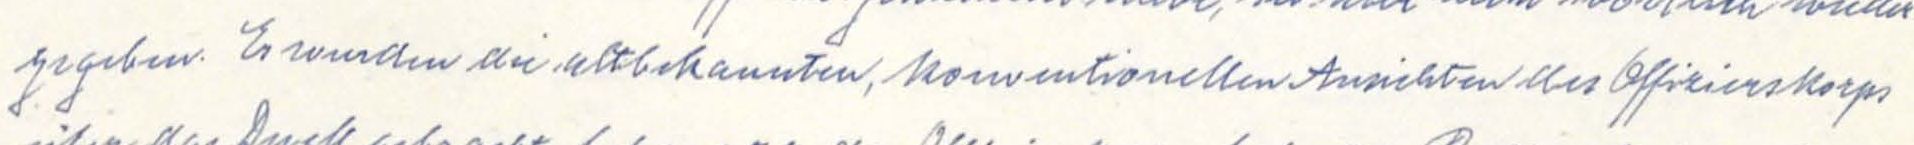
gegeben. Es wurden die altbekannten, konventionellen Ansichten des Offizierskorps
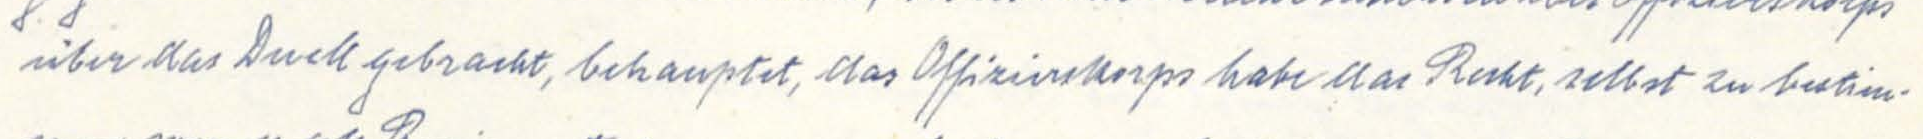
über das Duell gebracht, behauptet, das Offiziskorpss habe das Recht, selbst zu besti-
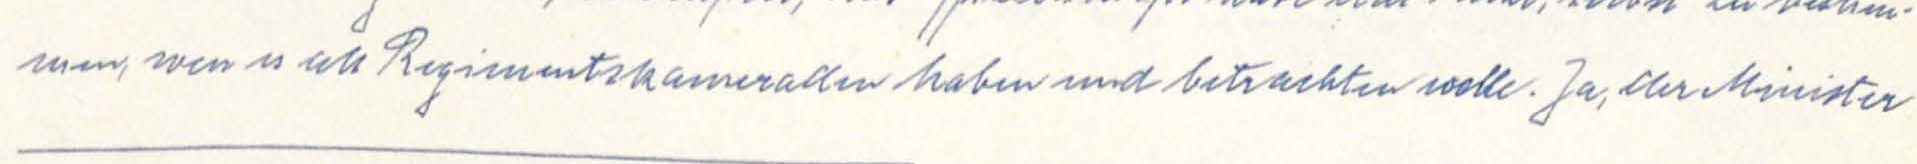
men, wen es als Regimentskameraden haben und betrachten wolle. Ja, der Minister
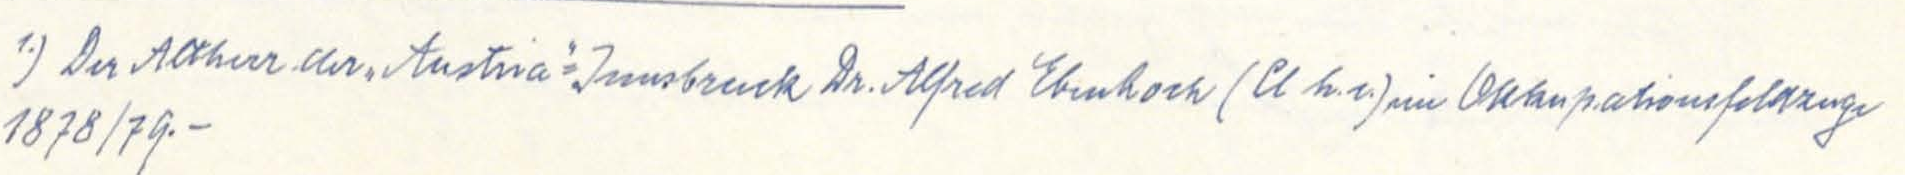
1.) Der Altherr der „Austria" - Innsbruck Dr. Alfred Ebenhoch (U.h.c) im Okkupationsfeldzuge
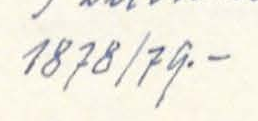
1878/79.-
